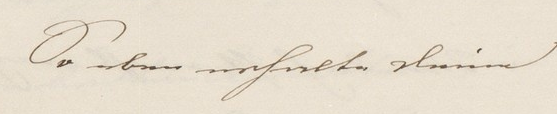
So eben erhalte Deine
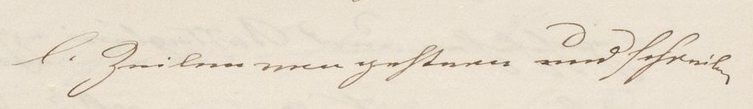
l. Zeilen von gestern und schreibe
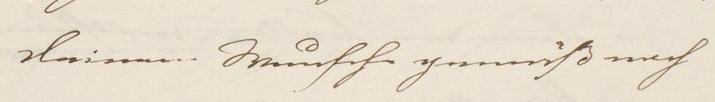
Deinem Wunsche gemäß noch
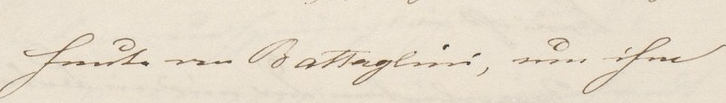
heute an Battaglini, um ihm
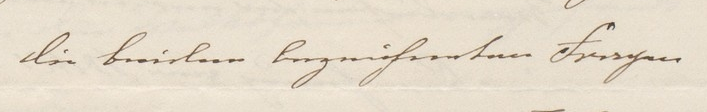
die beiden bezeichneten Fragen
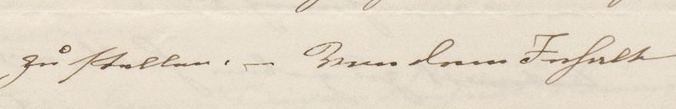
zu stellen. – Von dem Inhalt
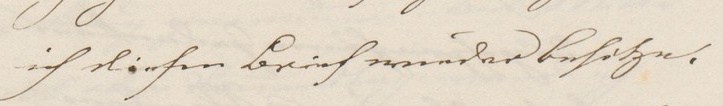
ich diesen Brief wieder besitze.
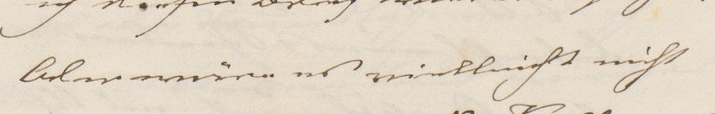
Aber wäre es vielleicht nicht
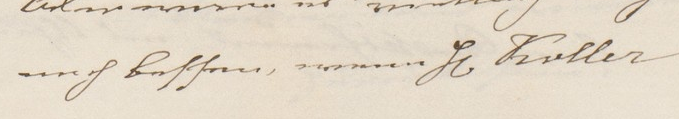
noch besser, wenn Herr Koller
